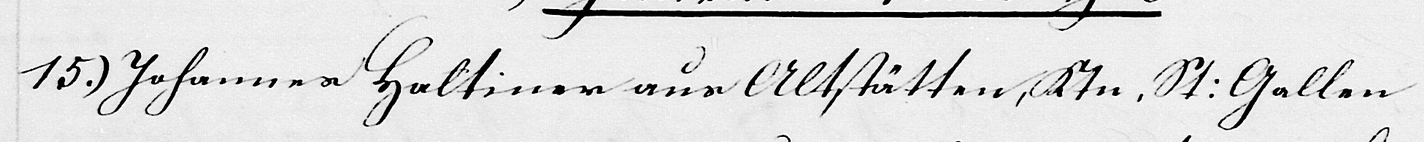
15.) Johannes Haltiner aus Altstätten, Ktn. St: Gallen
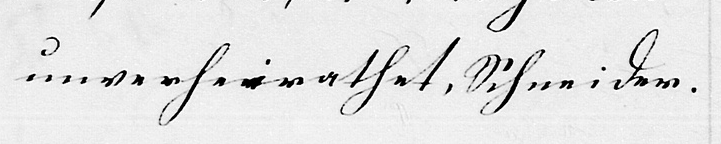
unverheirathet, Schneider.
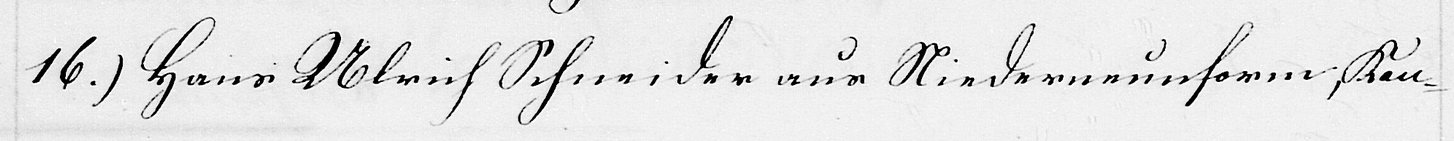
16.) Hans Ulrich Schneider aus Niederneunform, Kan¬
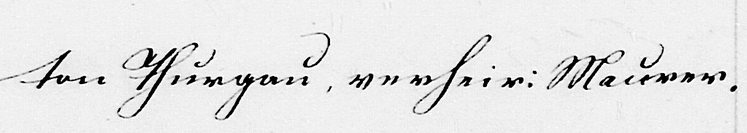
ton Thurgau, verheir: Maurer.
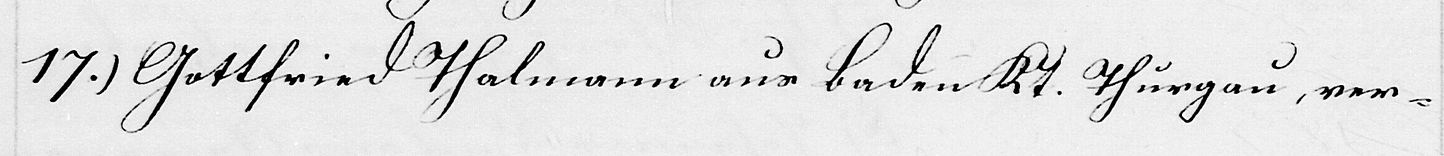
17.) Gottfried Thalmann aus Baden Kt. Thurgau, ver¬
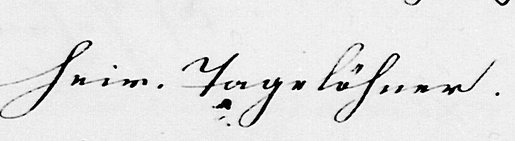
heir. Tagelöhner.
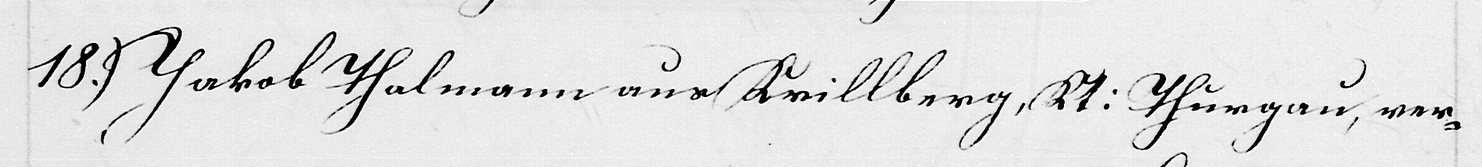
18.) Jakob Thalmann aus Krillberg, Kt: Thurgau, ver¬
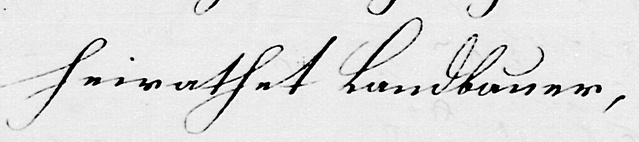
heirathet Landbauer,
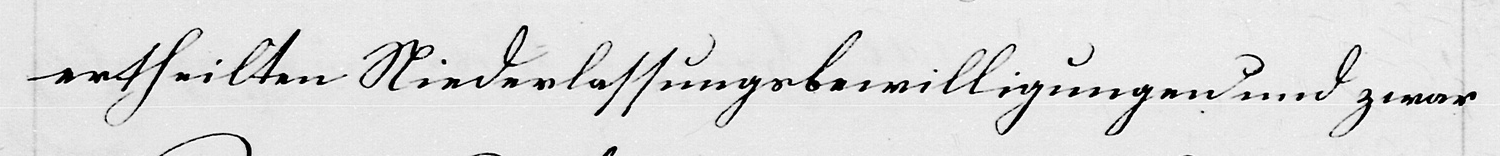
ertheilten Niederlassungsbewilligungen und zwar
